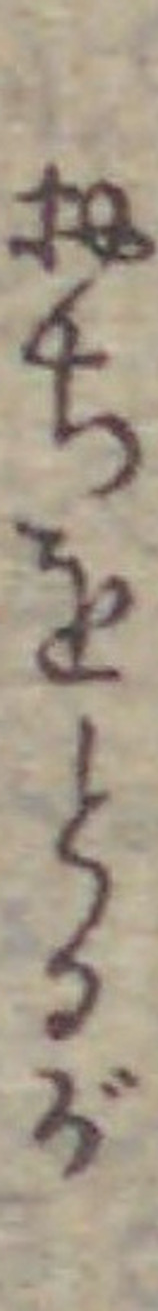おちをとるが
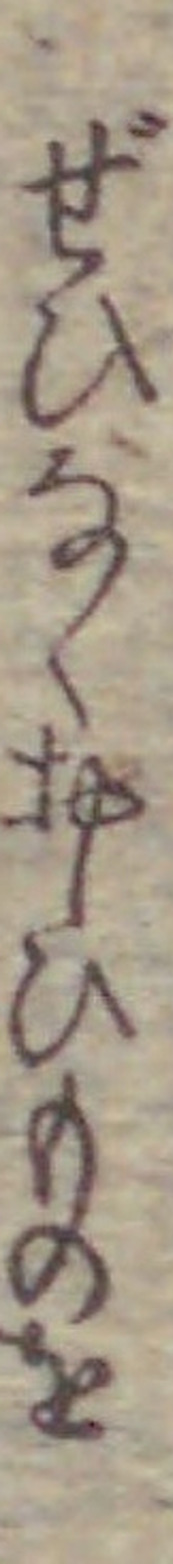ぜひなくおひものを
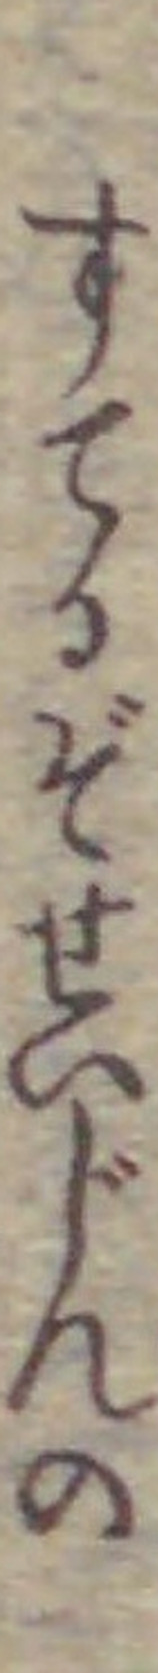すてるぞせいじんの
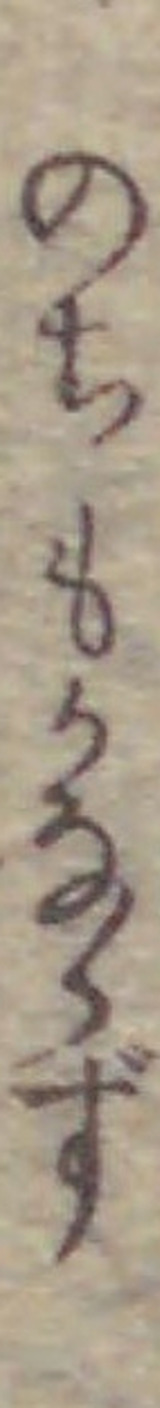のちもかならず
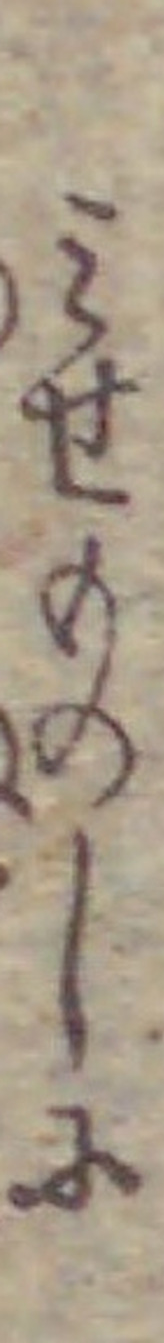みせものしに
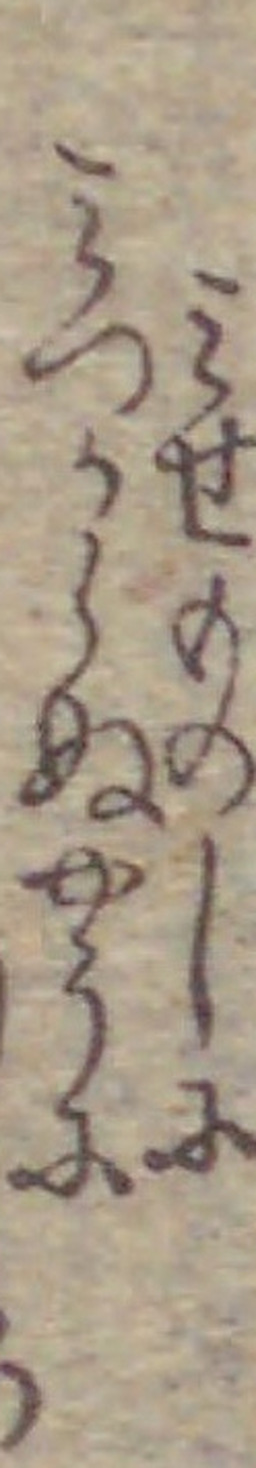みつからぬやふに

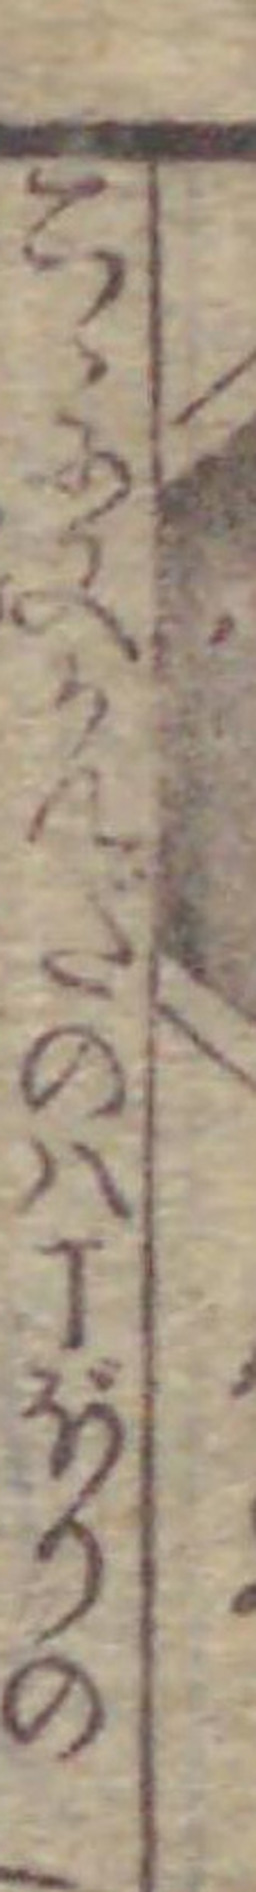こゝに又かんだの八丁ぼりの
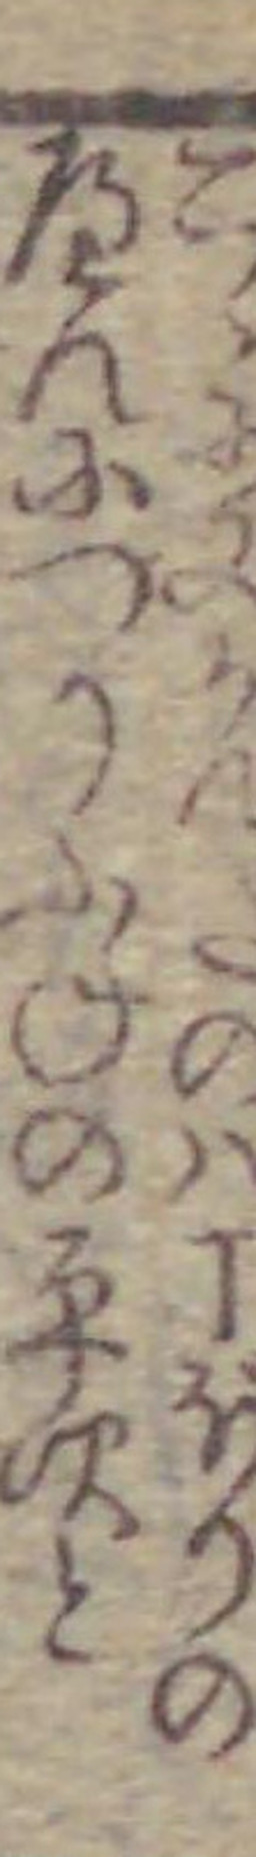へんにつりふねの平次と
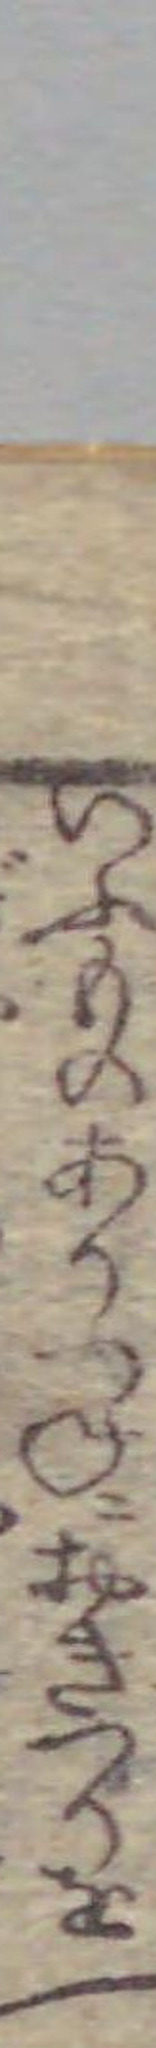いふものありつねにおきづりを
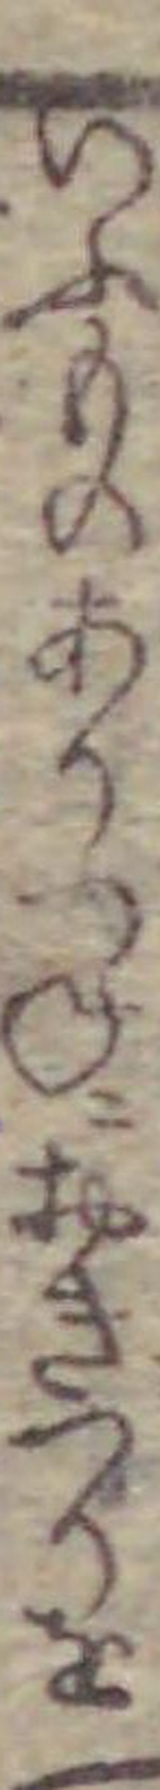いふものありつねにおきづりを
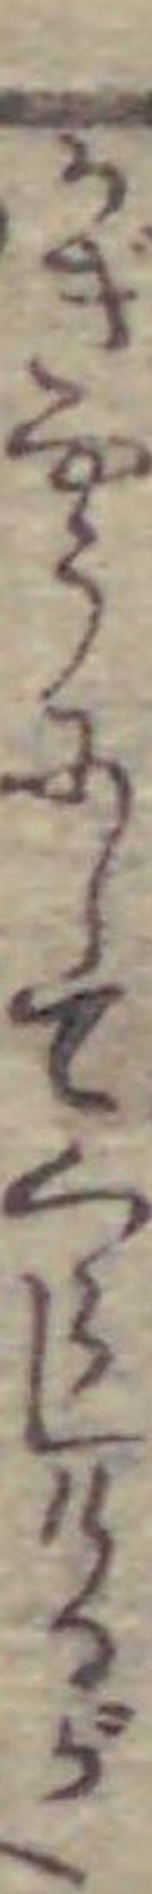かぎやうにしてくらしけるが
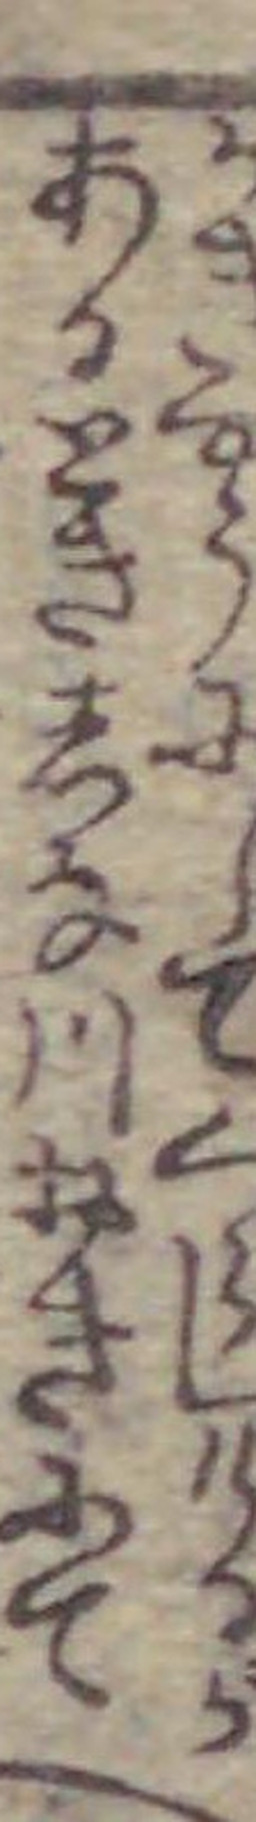あるときしな川おきにて
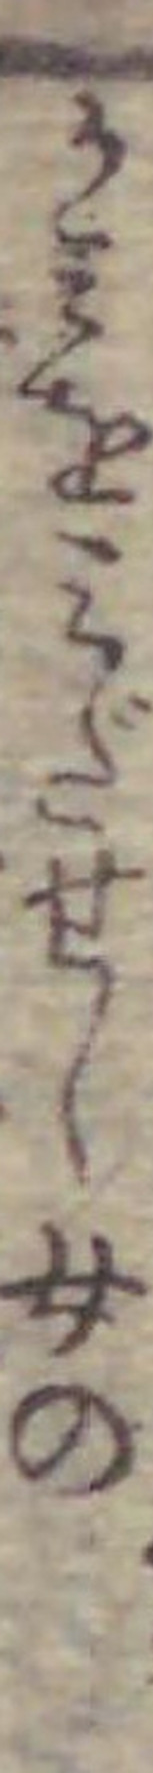かみをみだせし女の
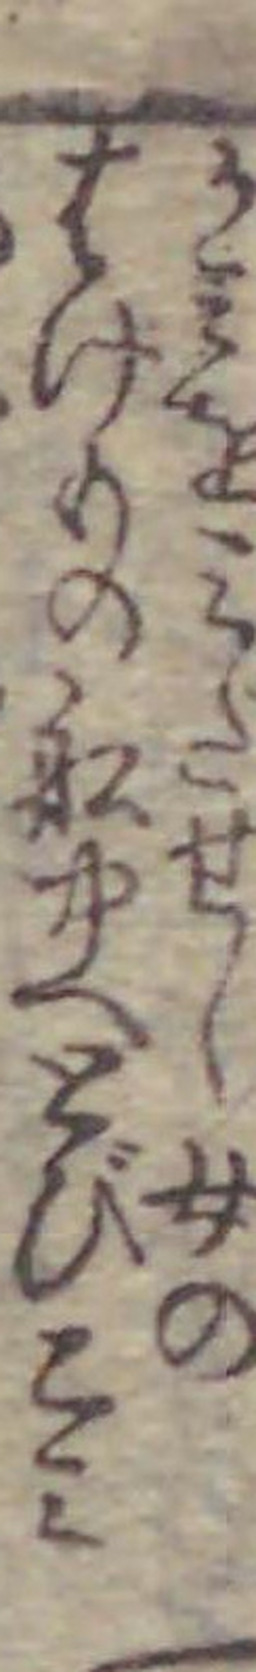はけもの船中へとびこみ
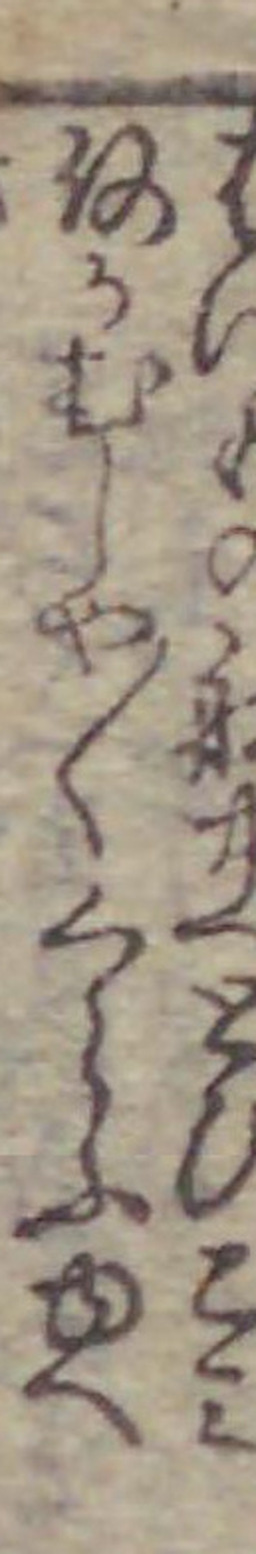何かむしや〳〵くらふゆへ
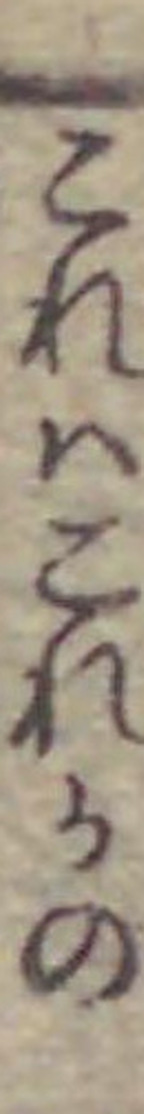これはこれかの
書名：箱入娘面屋人魚 3巻
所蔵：国立国会図書館 National Diet Library, JAPAN
